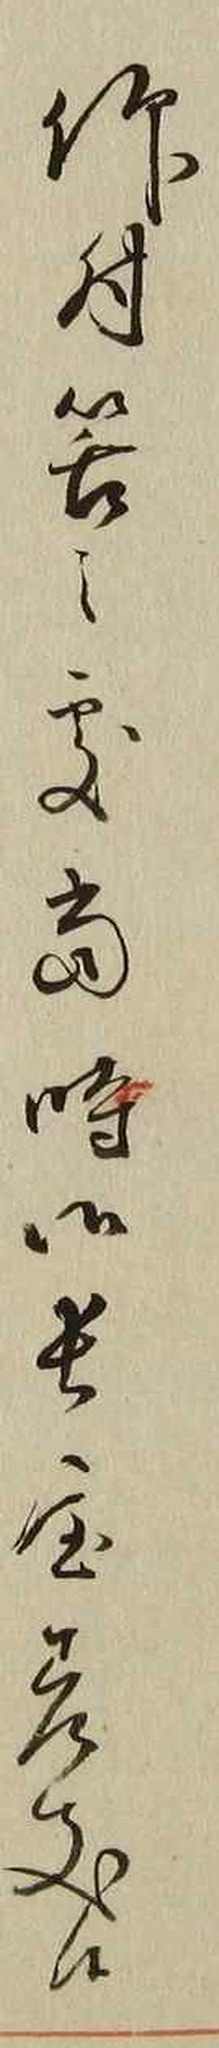仰付筈之処当時御長屋差支候
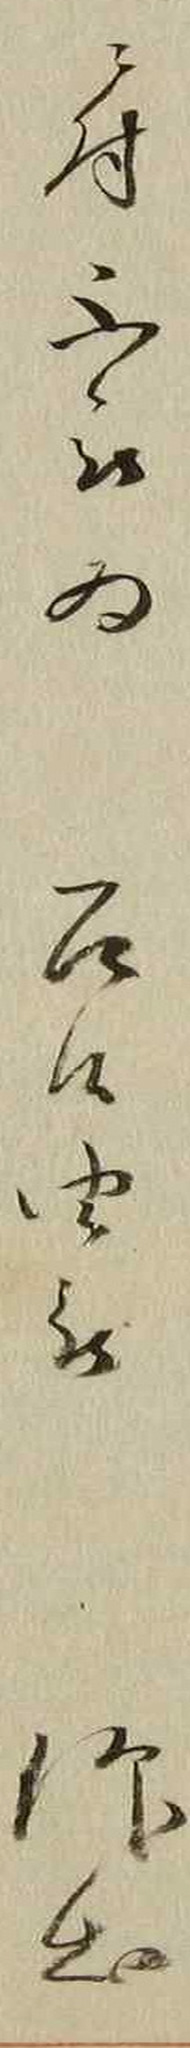ニ付不被為召候由被仰出
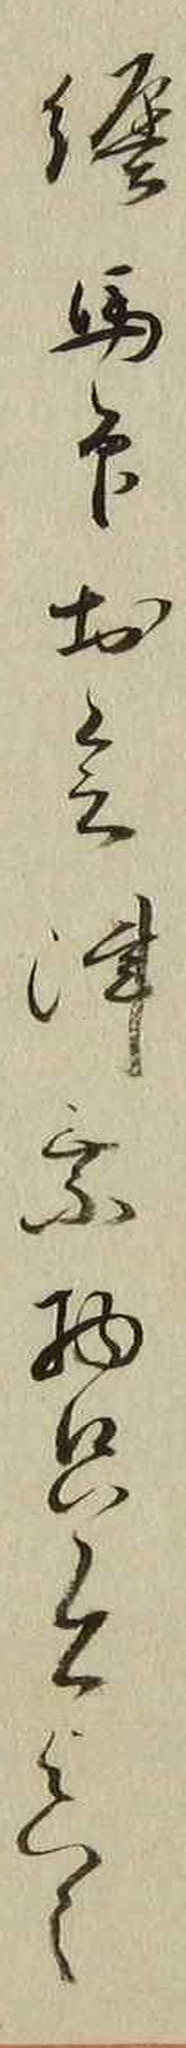纏馬印於会津乗物只今迄之
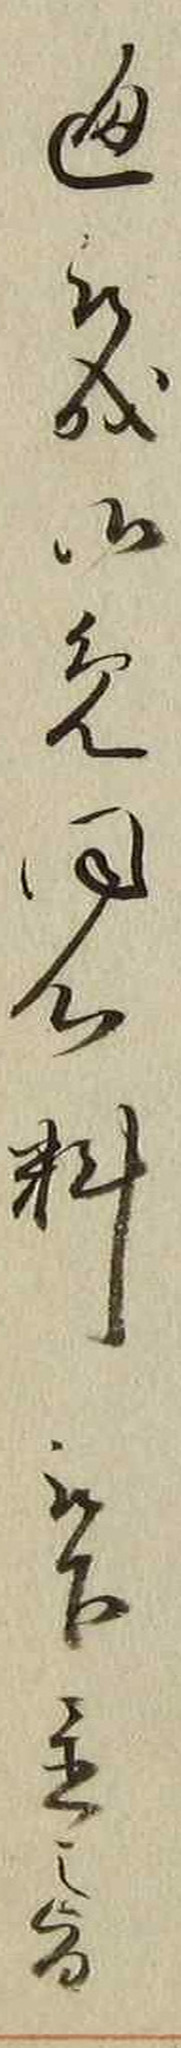通被成御免同心料被下置之旨
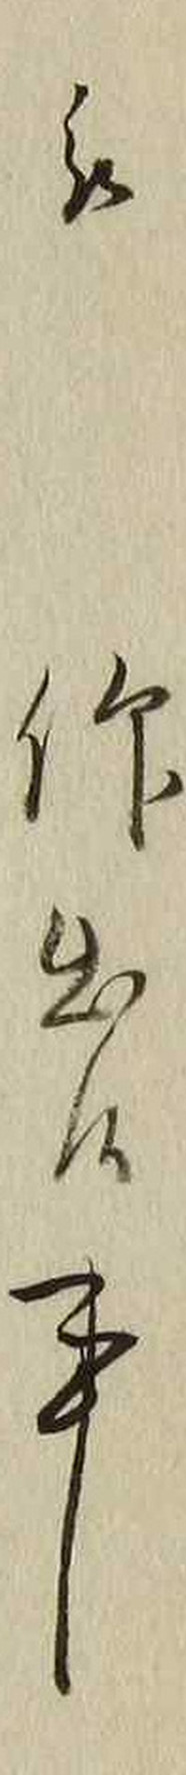被仰出候事
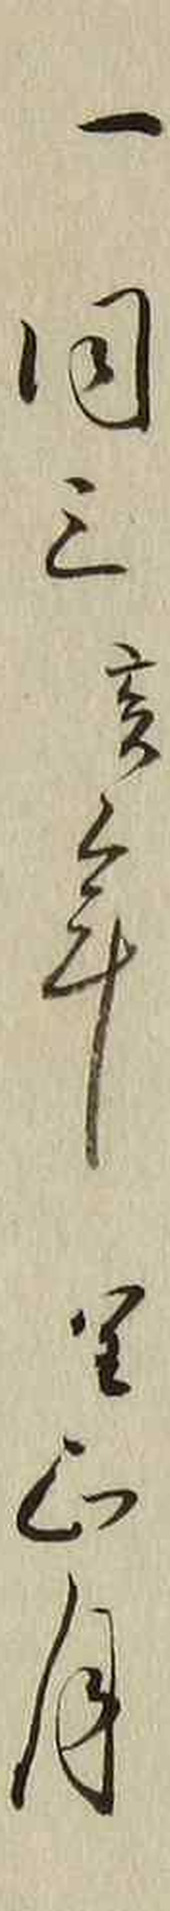一同三亥年閏正月
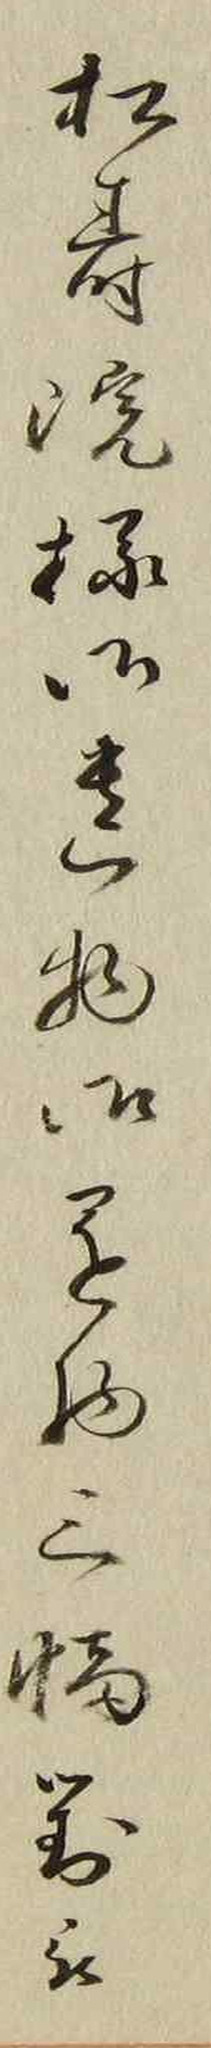松寿院様御遺物御懸物三幅対被
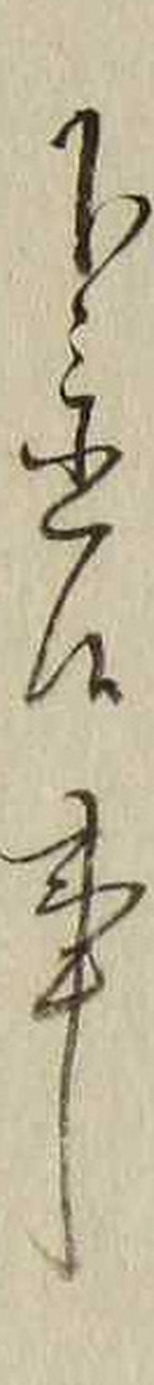下置候事
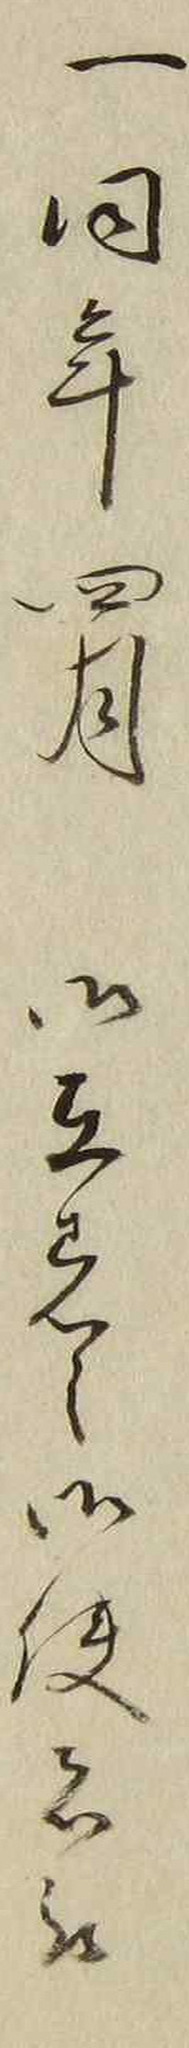一同年四月御在着之御使者被
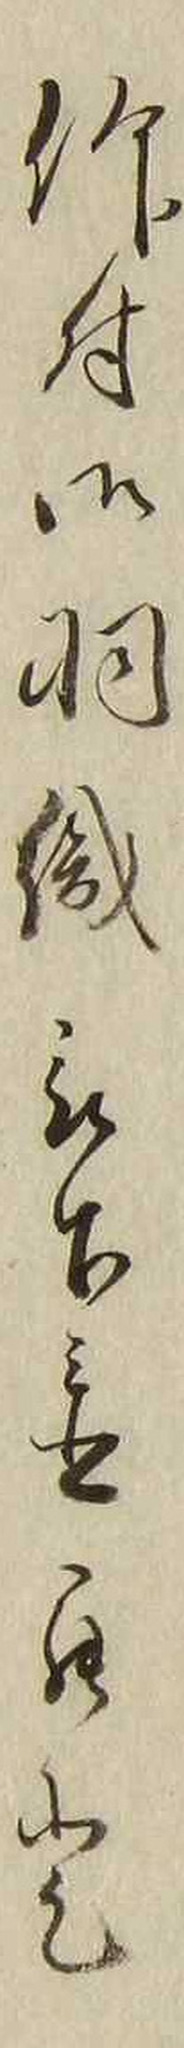仰付御羽織被下置罷登

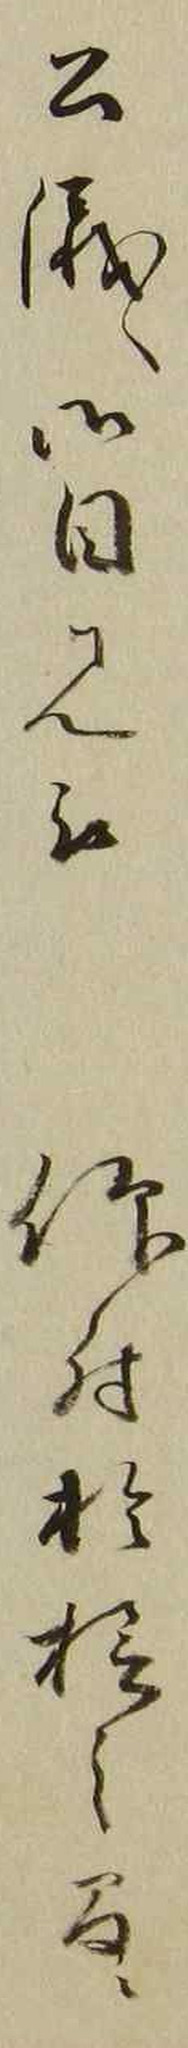公儀へ御目見被仰付於桧之間
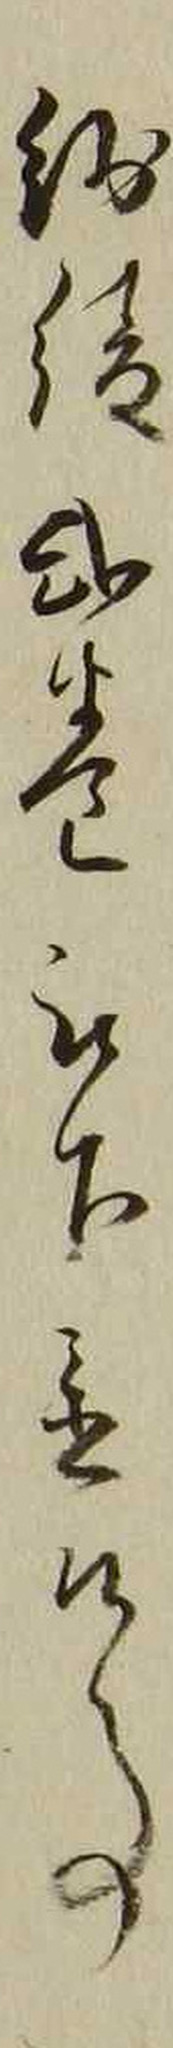紗綾弐巻被下置候事
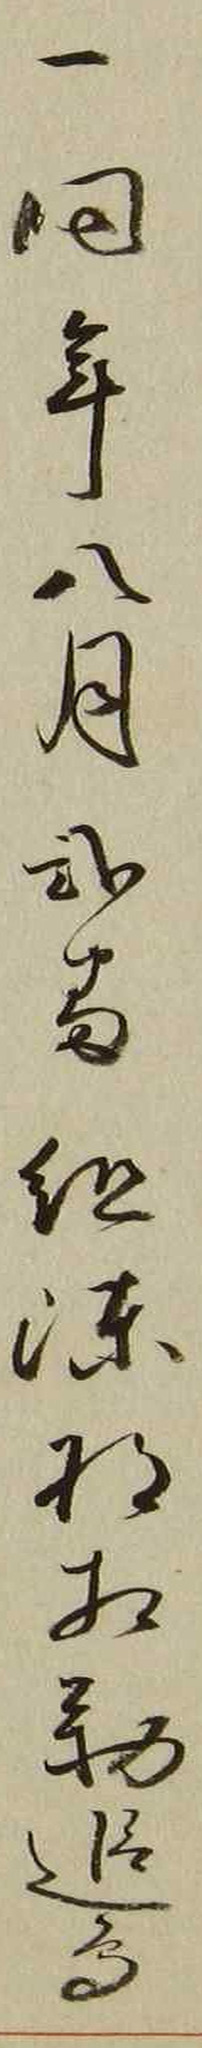一同年八月弐番組陣将相勤追鳥
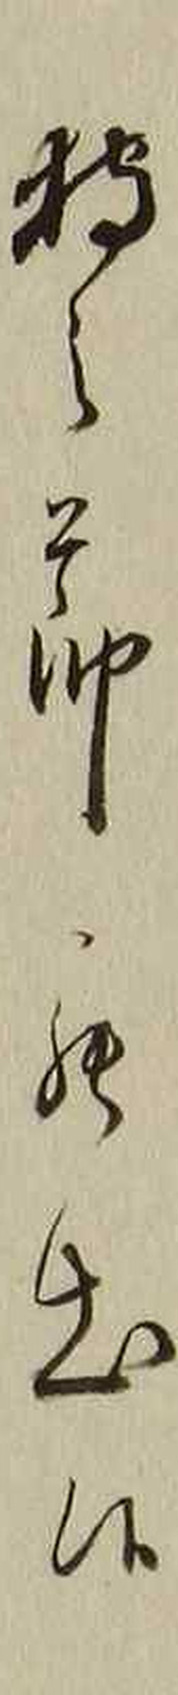狩之節罷出候
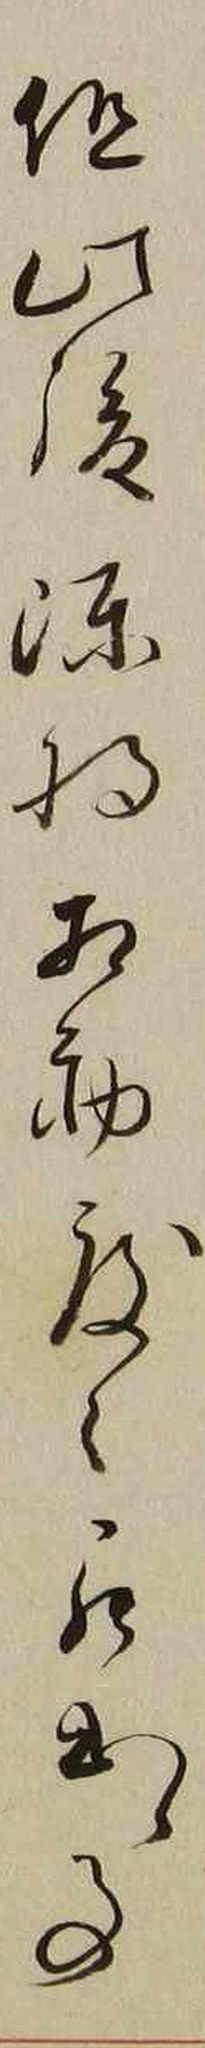但此後陣将相勤度々罷出候事
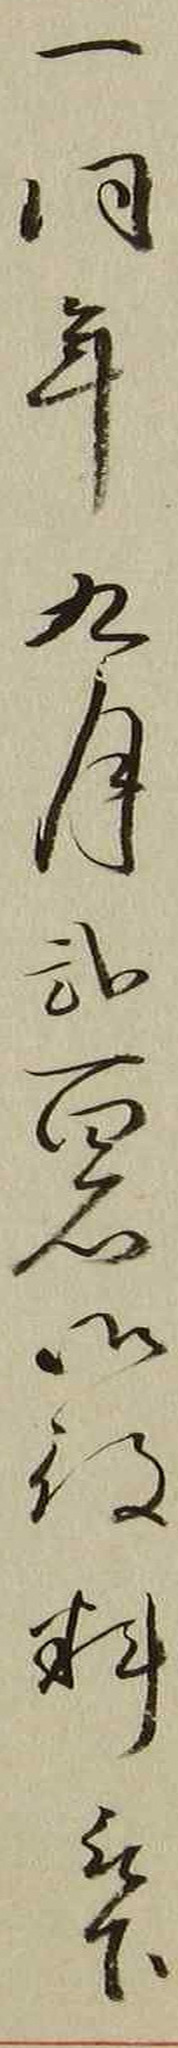一同年九月弐百石御役料被下
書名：諸士系譜　巻之2　い之部2
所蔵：会津若松市立会津図書館
